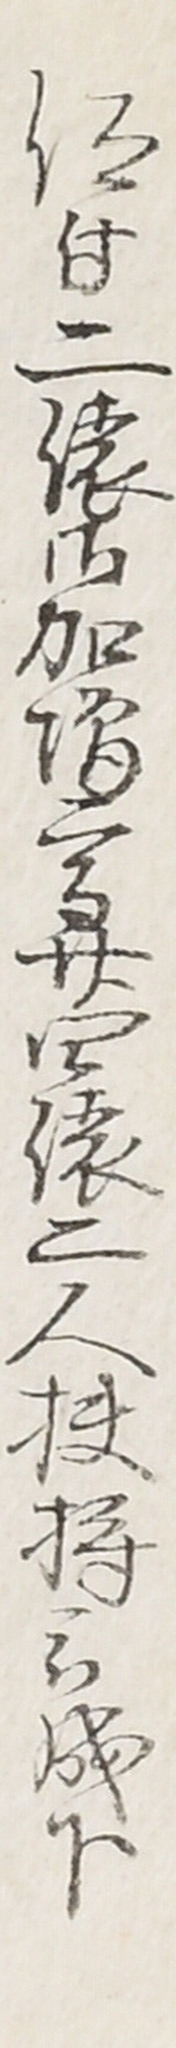仰付二俵御加増高廿四俵二人扶持被成下
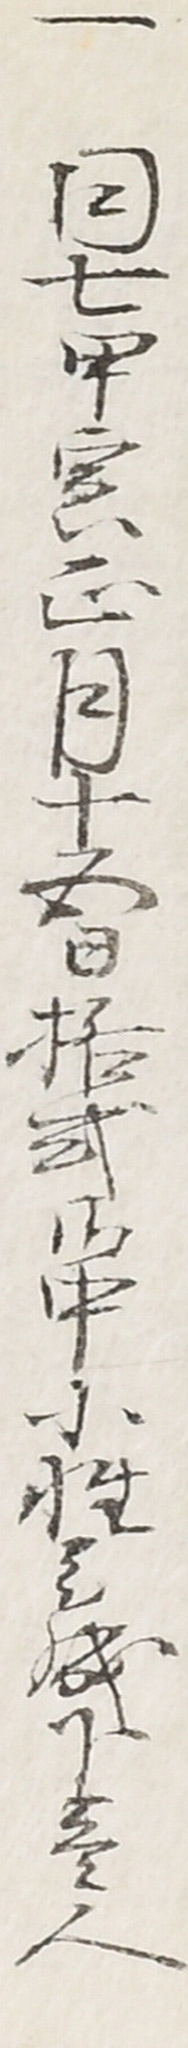一同七甲寅正月十五日格式御中小性被成下壱人
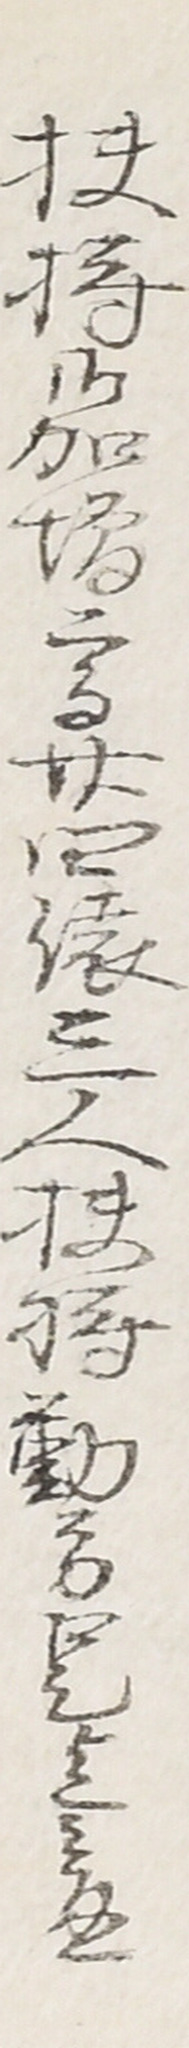扶持御加増高廿四俵三人扶持勤方是迄之通

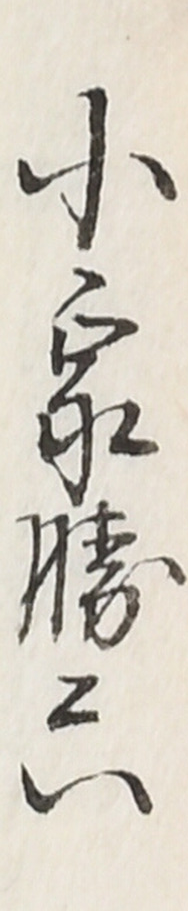小泉勝六
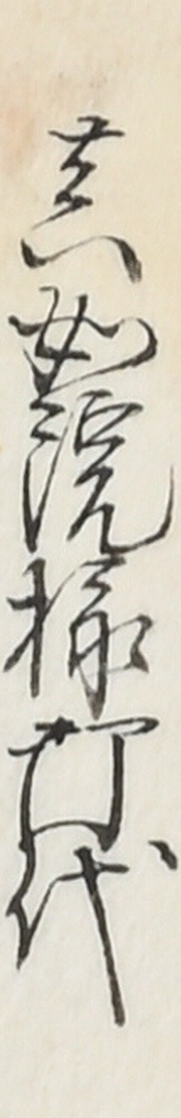真如院様御代
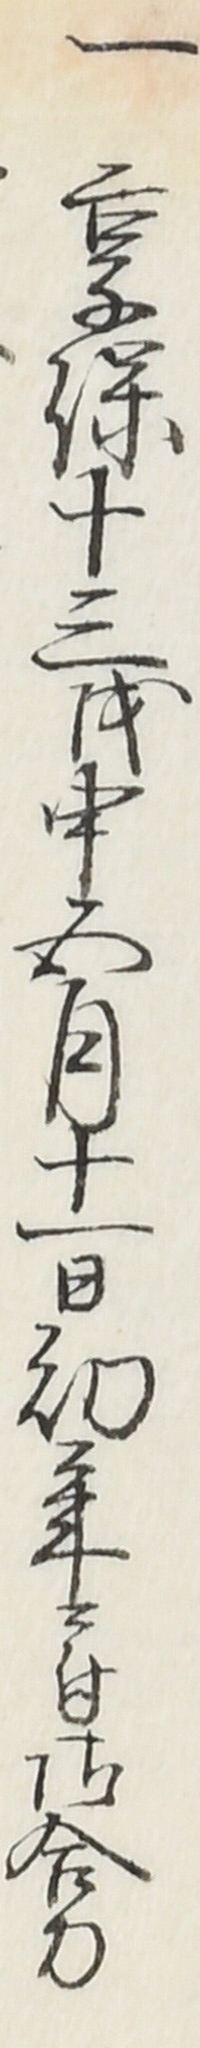一享保十三戊申五月十一月幼年ニ付御合力
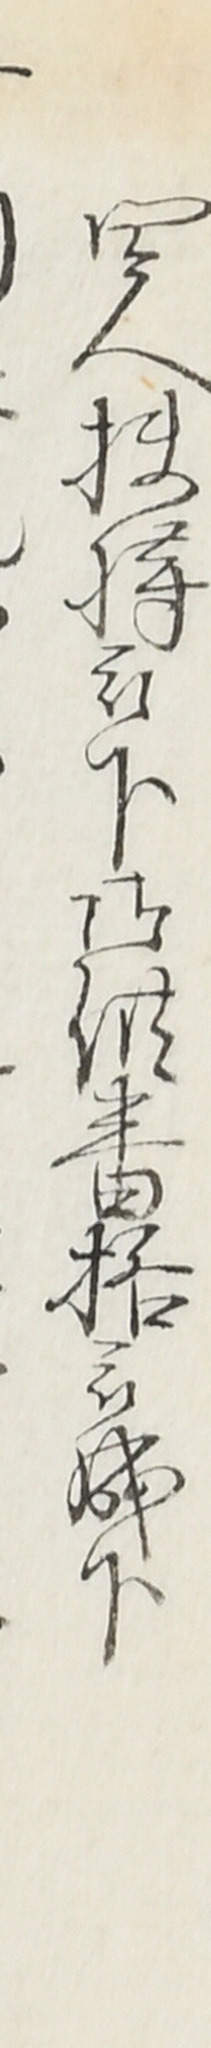四人扶持被下御供番格被成下
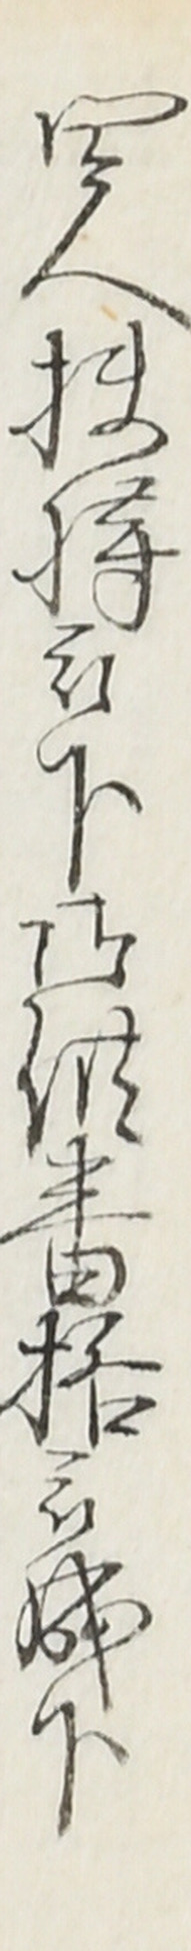四人扶持被下御供番格被成下
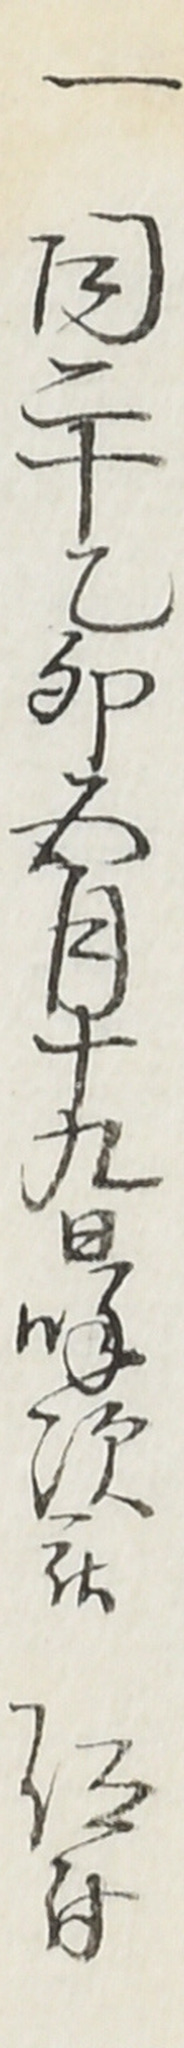一同二十乙卯五月十九日呼次被仰付
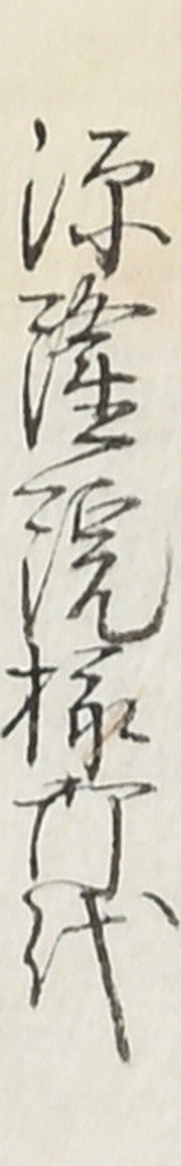源隆院様御代
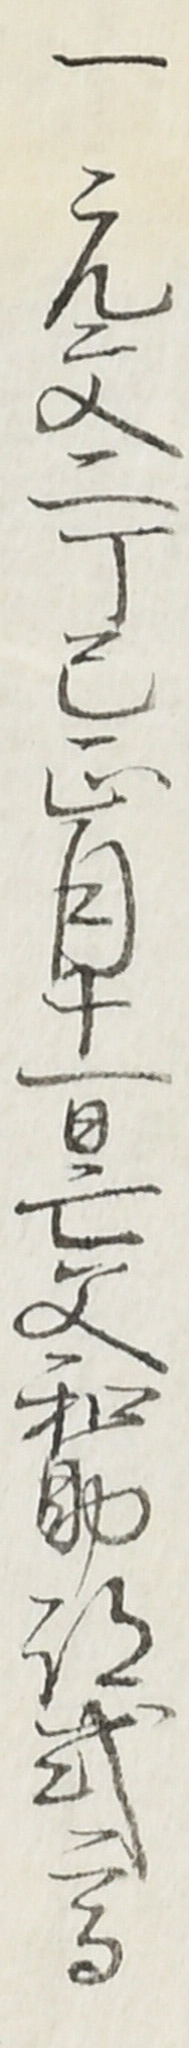一元文二丁巳正月十一月亡父和助跡式高
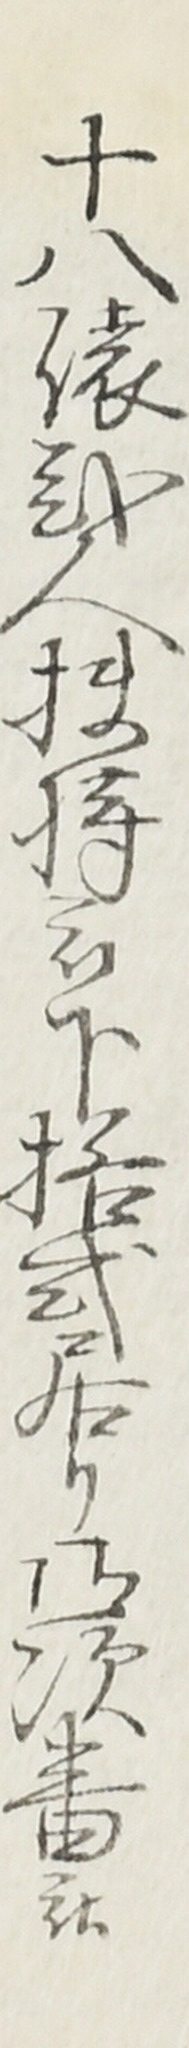十八俵弐人扶持被下格式居リ御次番被
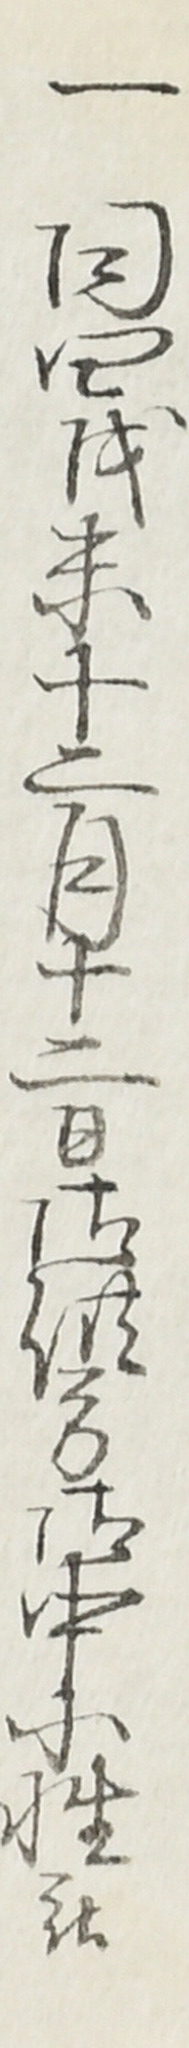一同四戊未十二月十二日御供方御中小性被
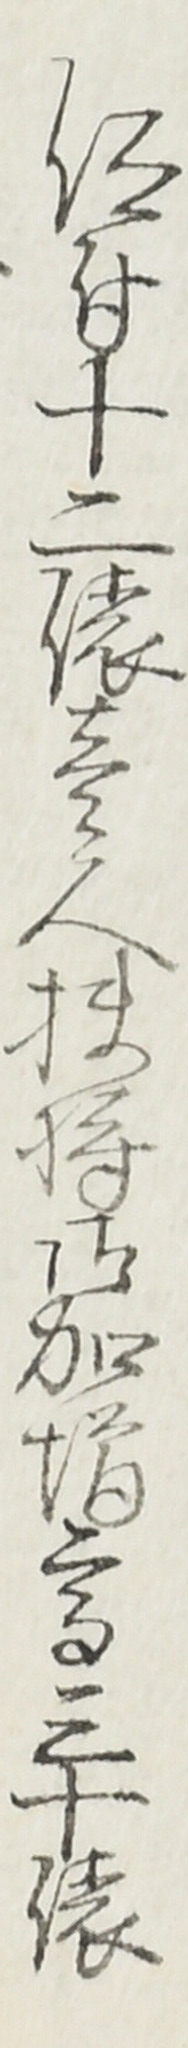仰付十二俵壱人扶持御加増高三十俵
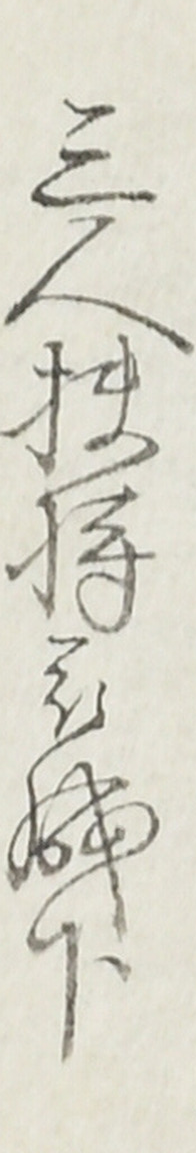三人扶持被成下
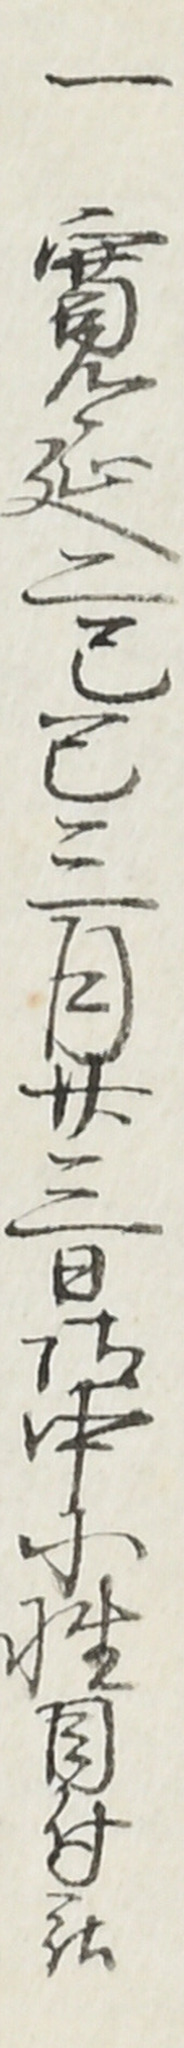一寛延二己巳三月廿三日御中小性目付被
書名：給人諸士勤仕録（七）
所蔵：伊那市立高遠町図書館・合同会社AMANE
